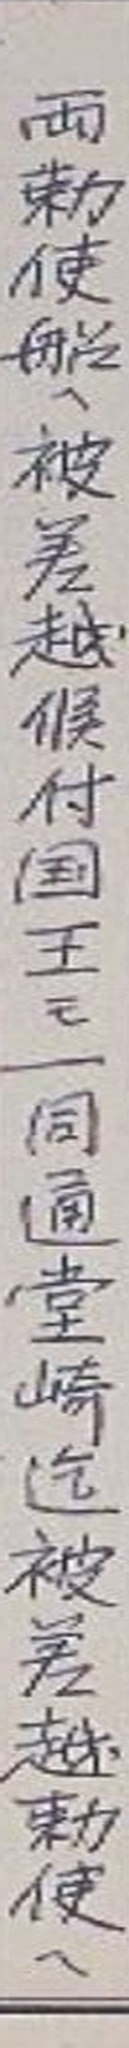両勅使船へ被差越候付国王も一同通堂崎迄被差越勅使へ
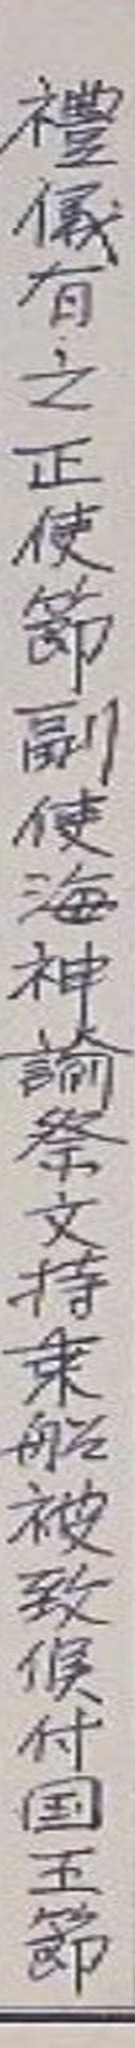礼儀有之正使節副使海神諭祭文持乗船被致候付国王節
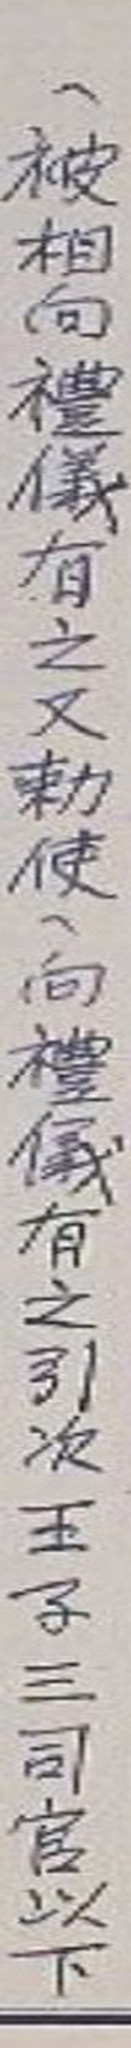へ被相向礼儀有之又勅使へ向礼儀有之引次王子三司官以下
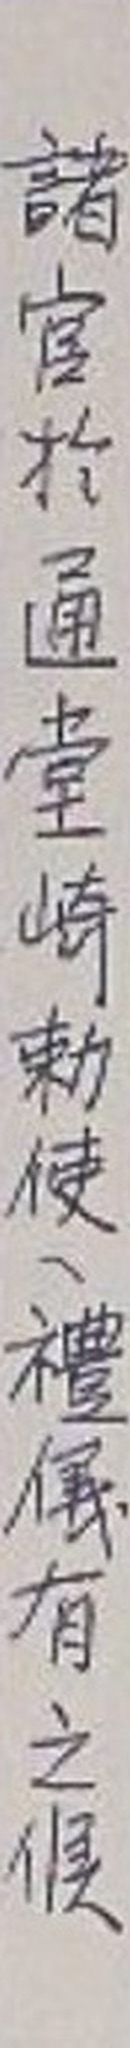諸官於通堂崎勅使へ礼儀有之候
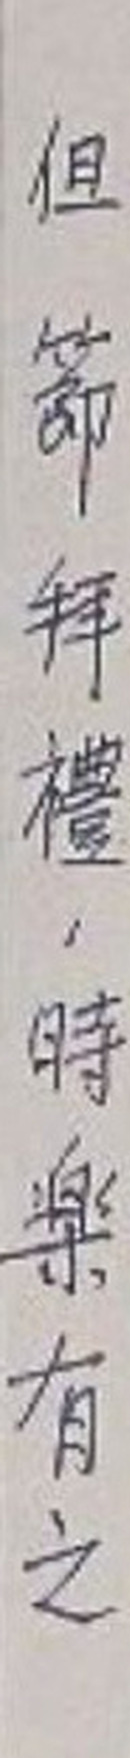但節拝礼の時楽有之
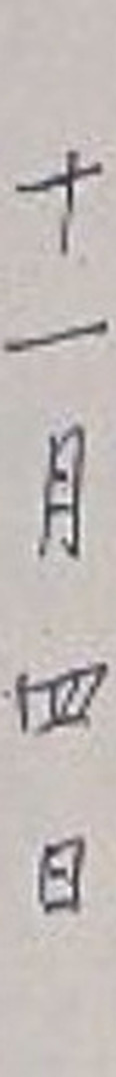十一月四日
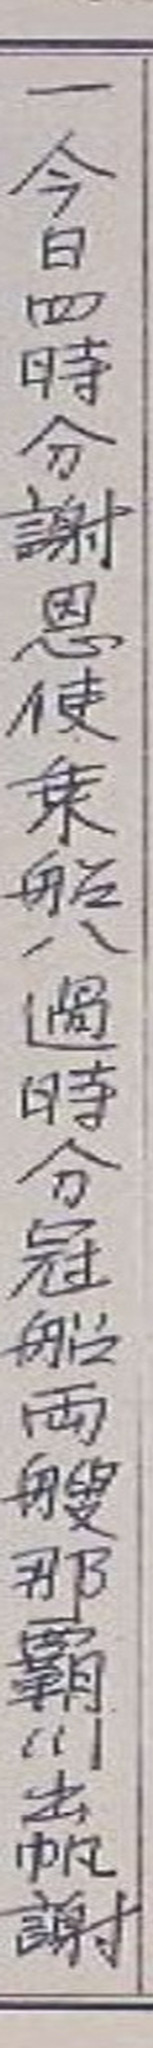一今日四時分謝恩使乗船八過時分冠船両艘那覇川出帆謝
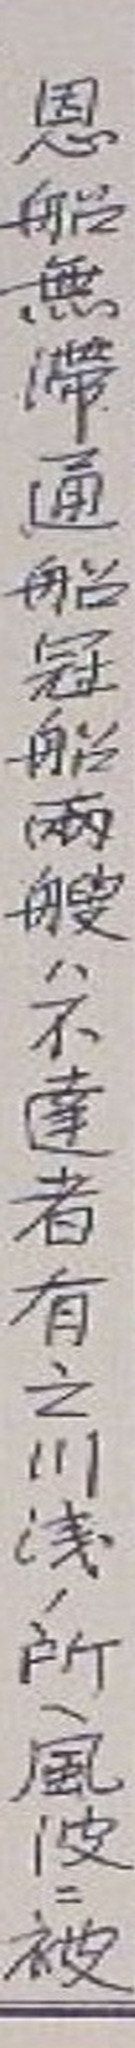恩船無滞通船冠船両艘は不達者有之川浅の所へ風波に被
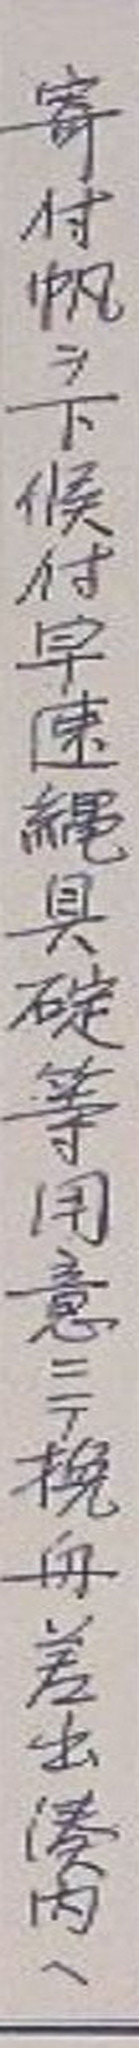寄付帆を下候付早速縄具碇等用意にて挽舟差出湊内へ

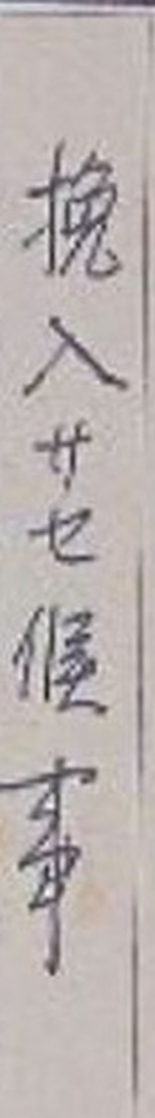挽入させ候事
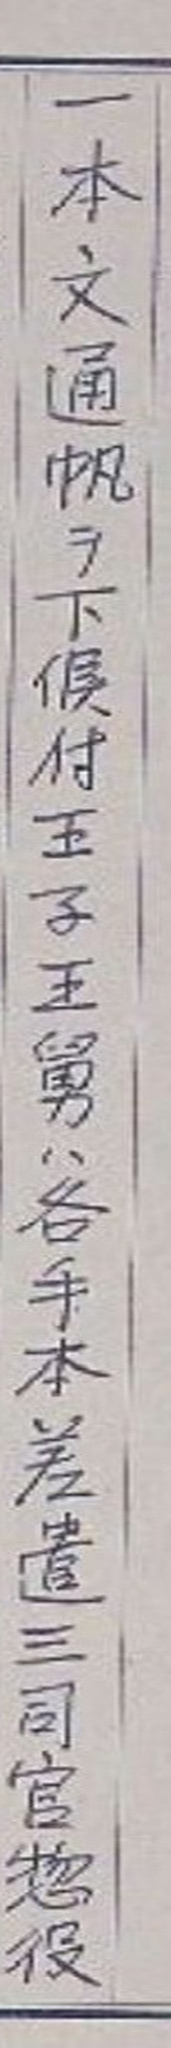一本文通帆を下候付王子王舅は各手本差遣三司官惣役
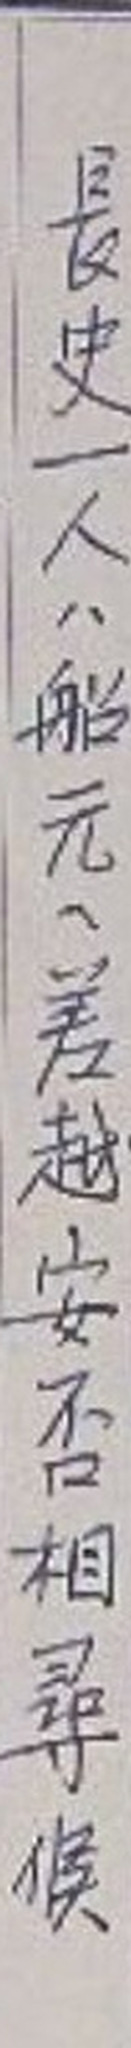長史一人は船元へ差越安否相尋候
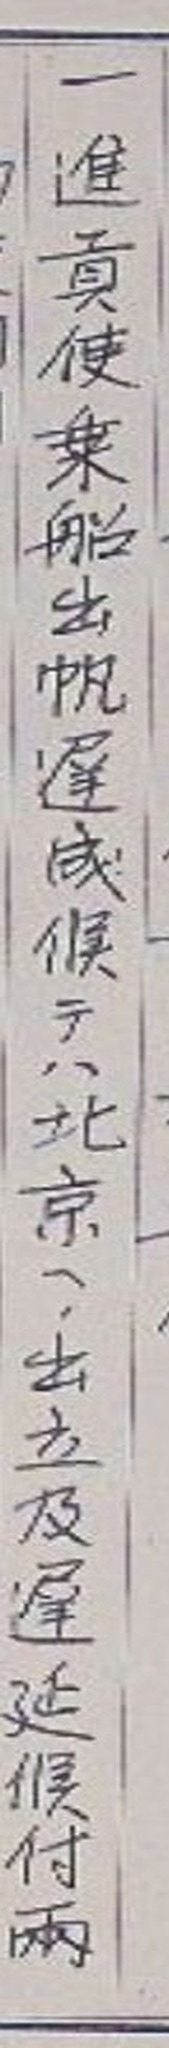一進貢使乗船出帆遅成候ては北京への出立及遅延候付両
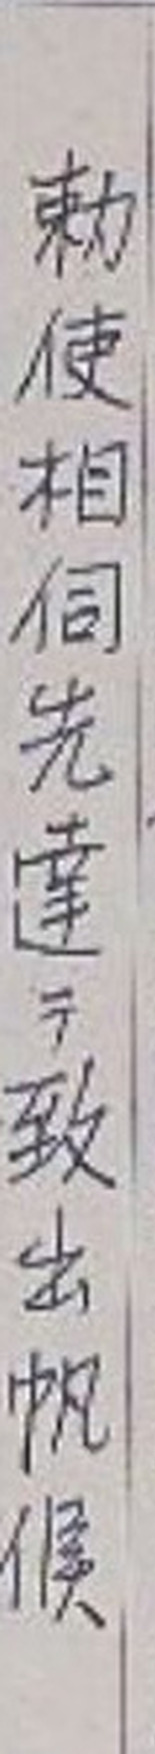勅使相伺先達て致出帆候
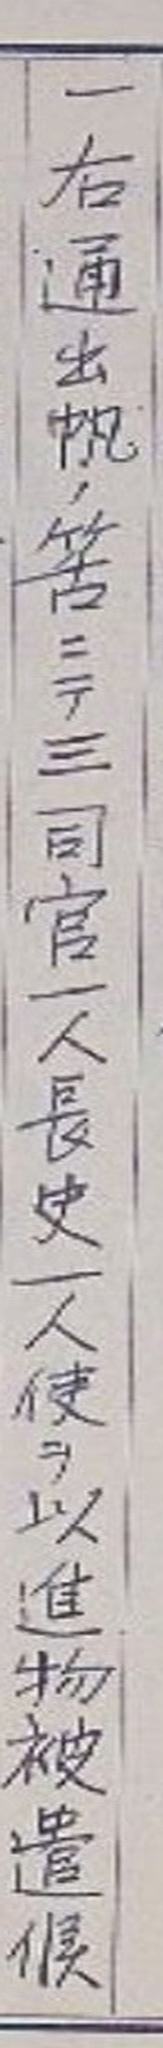一右通出帆の筈にて三司官一人長史一人使を以進物被遣候
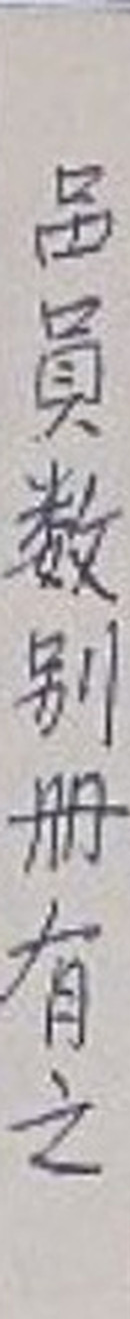品員数別冊有之
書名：支那冊封使来琉諸記 下巻
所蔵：University of the Ryukyus Library
